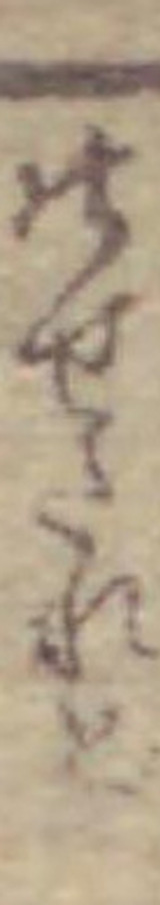のせたれど
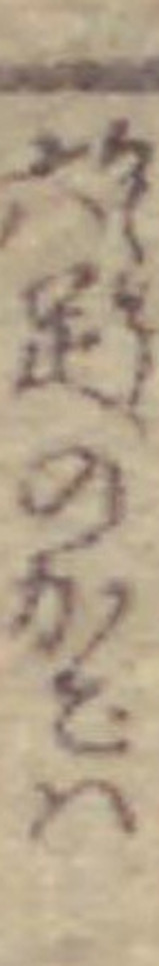六足のかごは
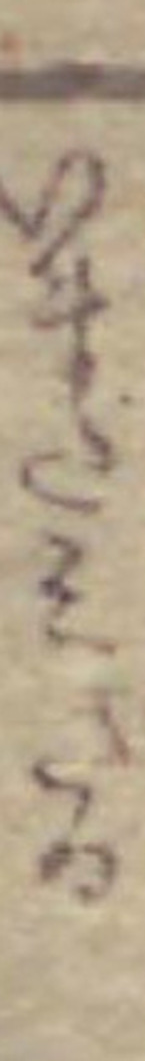いまたみざる
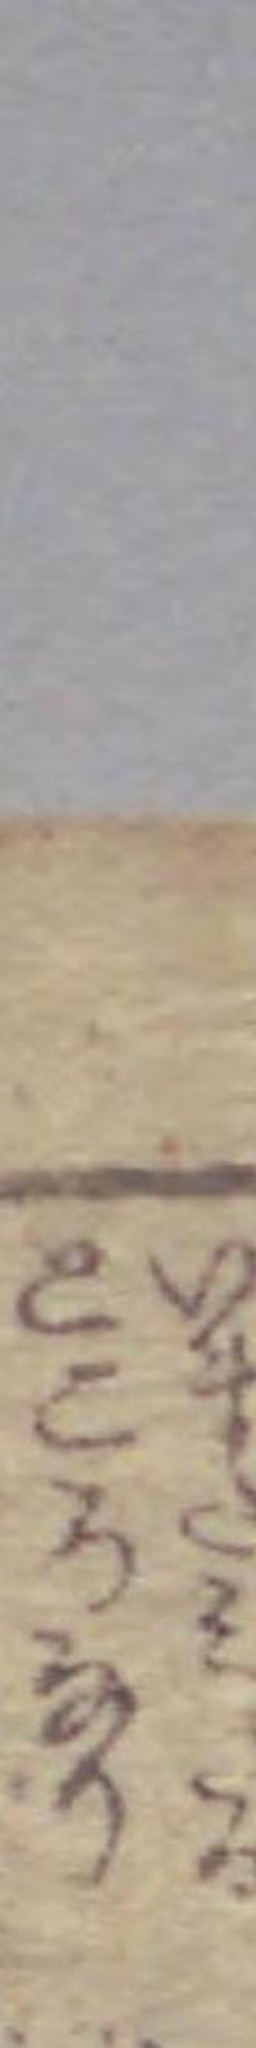ところなり
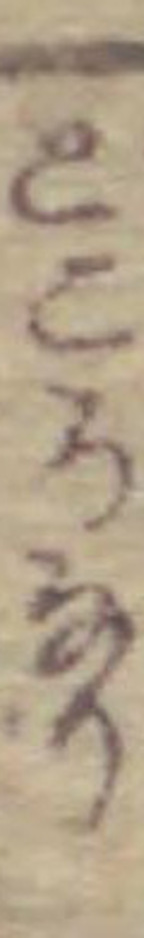ところなり
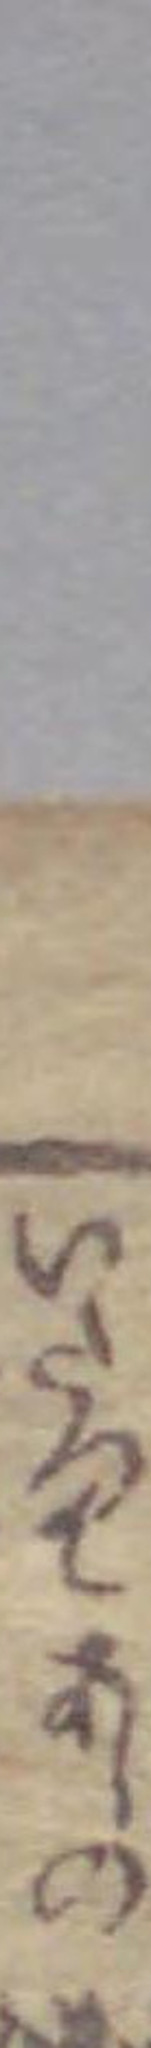いたつてあしの
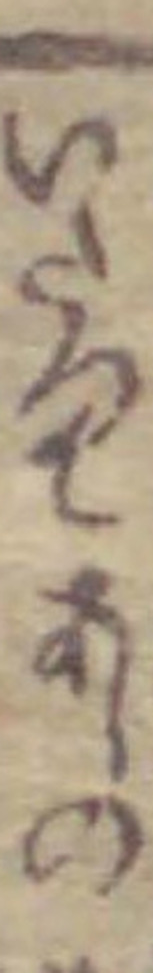いたつてあしの
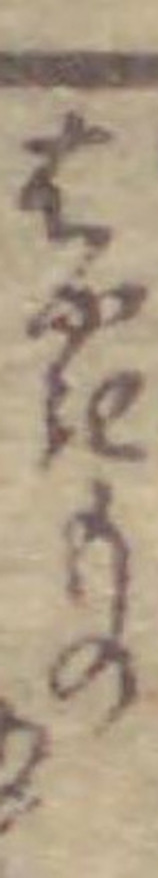はやきものにて
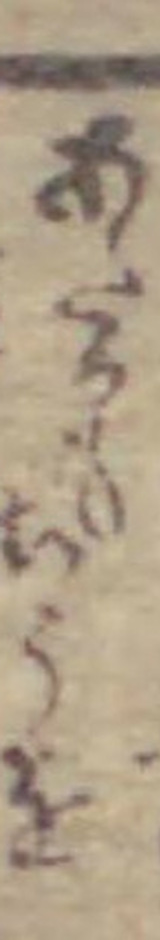あたかもちうを
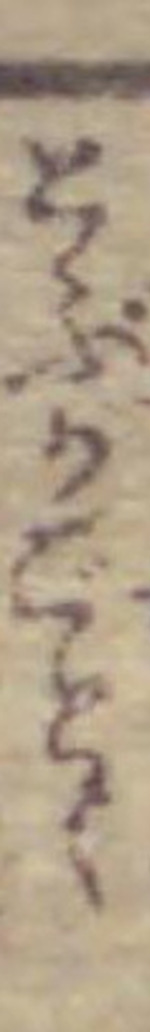とぶがごとく
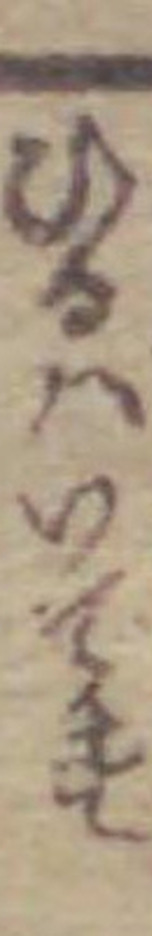ひるはいでず
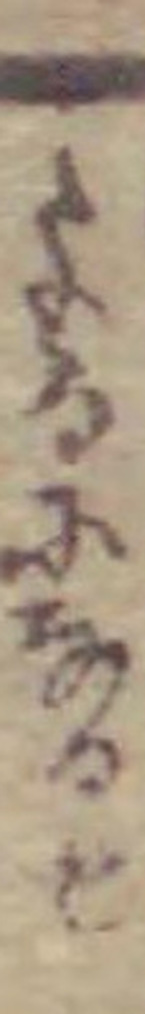よるになると
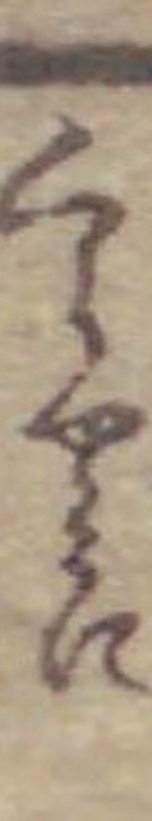くらやみに
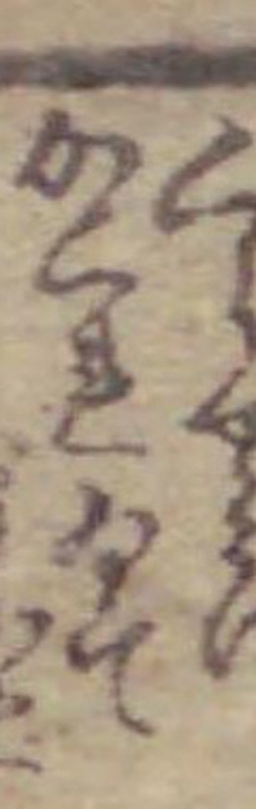かくれゐて

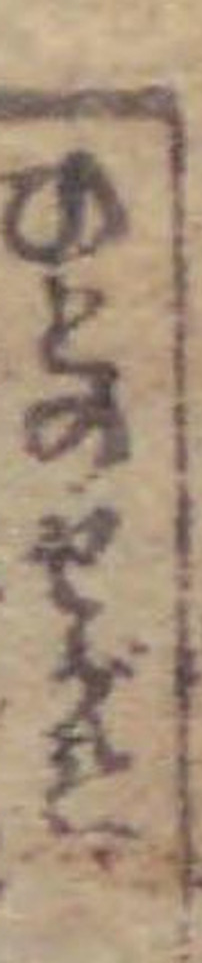ひとのせがれ
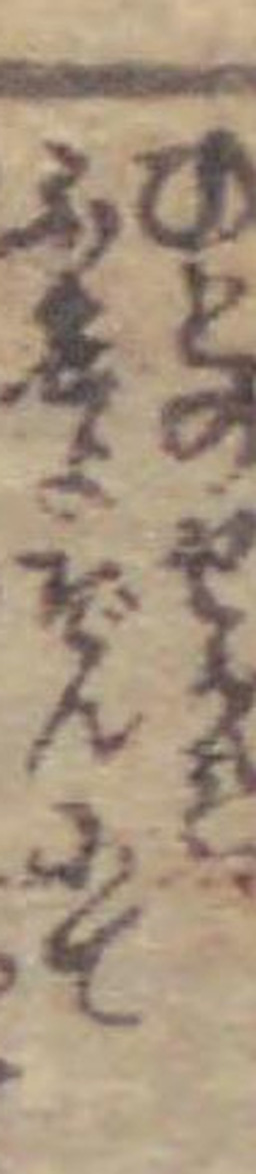ふしよぞんにて
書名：化物和本草 : 3巻
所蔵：国立国会図書館 National Diet Library, JAPAN
